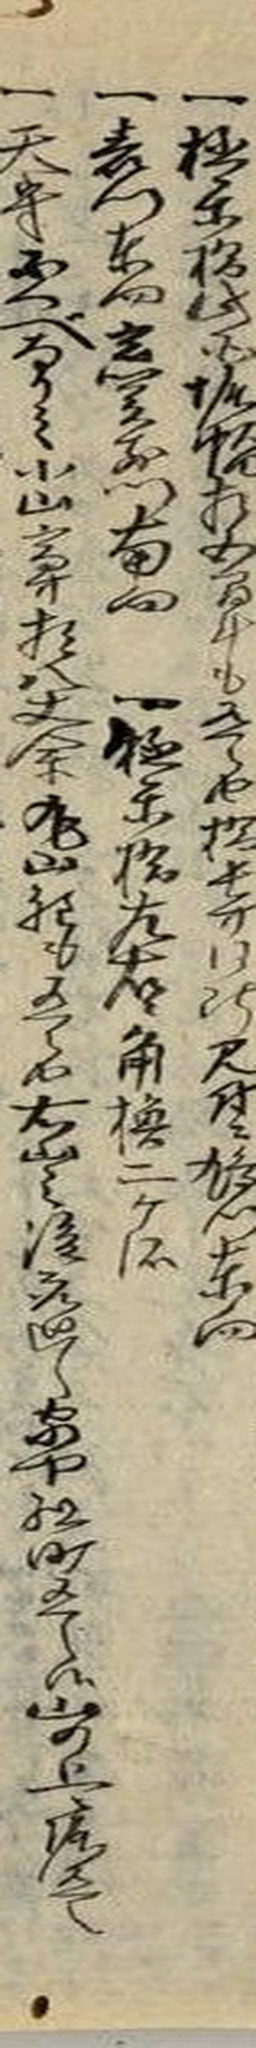一天守ふくべなり之小山高サ拾八丈余丸山程も有之由右山之後取廻し家中組町有之候山の上ニ堀有之
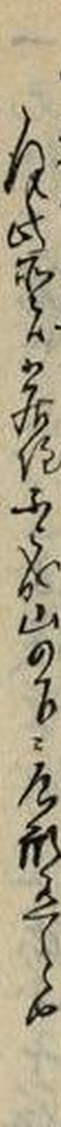候得共此所ニハ御居住不被成山の下ニ屋形有之候由
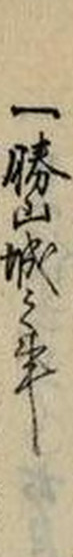一勝山城之事
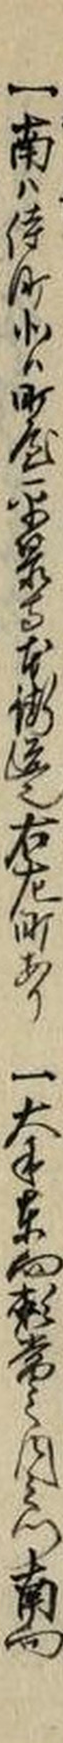一南ハ侍町北ハ町屋平泉寺本街道也右左町あり一大手東向頬当之内之門南向
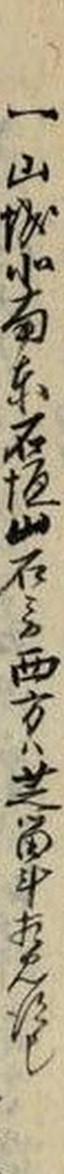一山城北南東石垣山石ニ而西方ハ芝留斗相見得申候
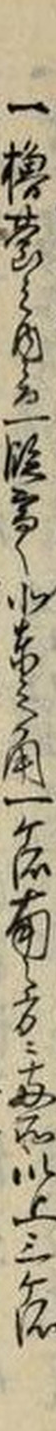一櫓台之内ニ而一段高く北東之角一ケ所南之方ニ両所以上三ケ所
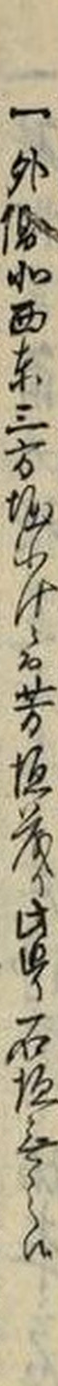一外側北西東三方堀わけニ而芳垣茂り此廻り石垣無之候
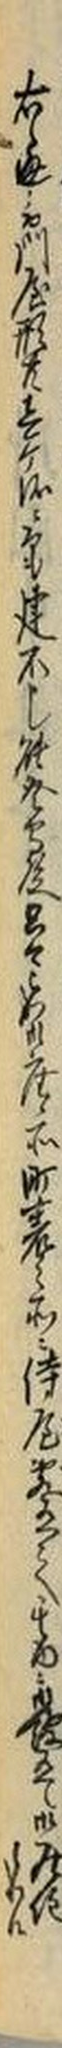右之通ニ而門屋形共壱ケ所ニ而も建不申候能登守殿只今被成御座候所町裏之所ニ侍屋敷有之其内ニ御館有之御居住被成候
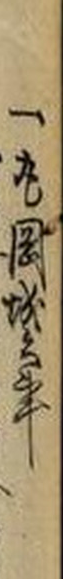一丸岡城之事
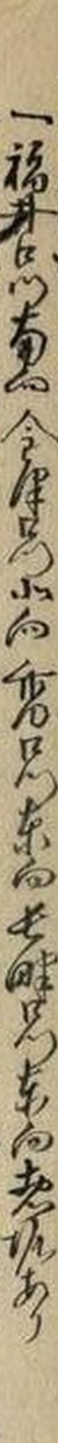一福井口門南向金津口門北向竹田口門東向長畦口門東向惣堀あり
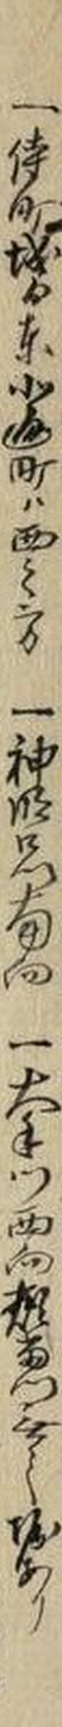一侍町城ゟ東北通町ハ西之方一神明口門南向一大手門西向頬当門無之堀あり
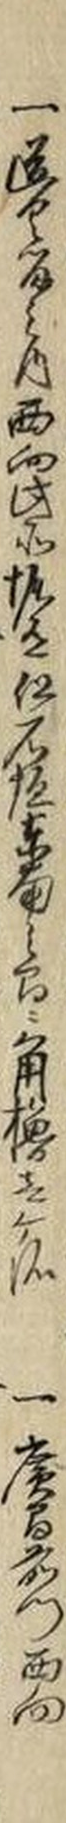一道具留之内西向此所堀有但石垣東南之間ニ角櫓壱ケ所一広間前門西向
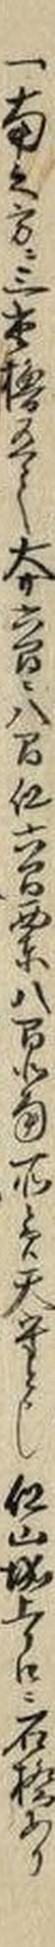一南之方ニ三重櫓有之大サ六間ニ八間但六間西東八間北南所ニ而ハ天守と申候但山城上り口ニ石橋あり
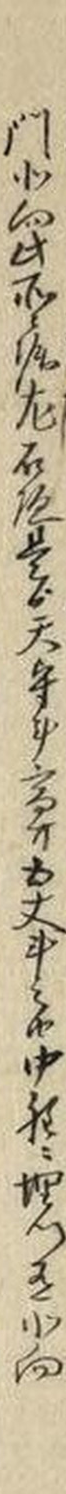門北向此所ニ堀左石垣是ゟ天守斗高サ五丈斗之由中程ニ埋門有北向
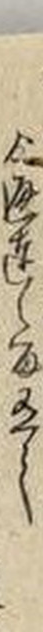ゟ通達之留有之
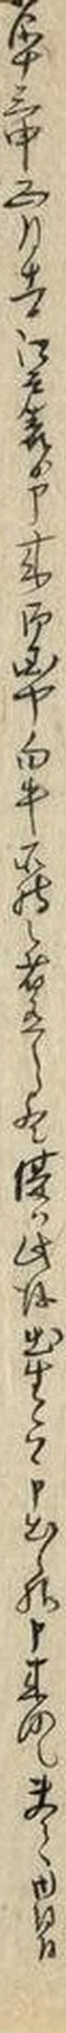一享保十三申正月十一日江戸表ゟ申来御国中白牛所持之者有之歟復ハ此後出生候ハヽ申出候様申来仍之夫々へ御目付
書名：御国他国諸事之部
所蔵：福井県文書館 Fukui Prefectural Archives
